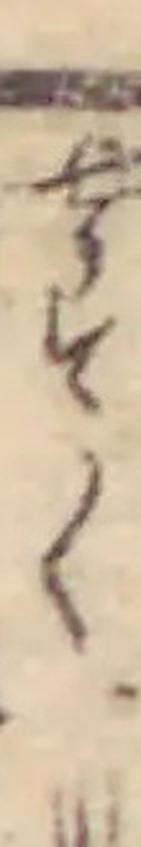やすく
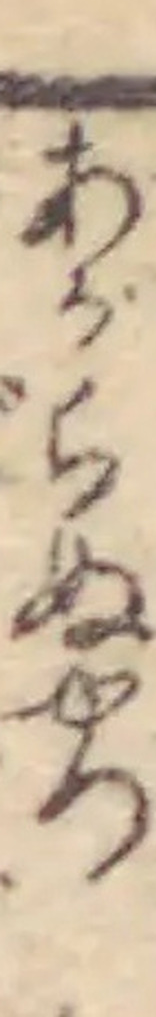あからぬやう
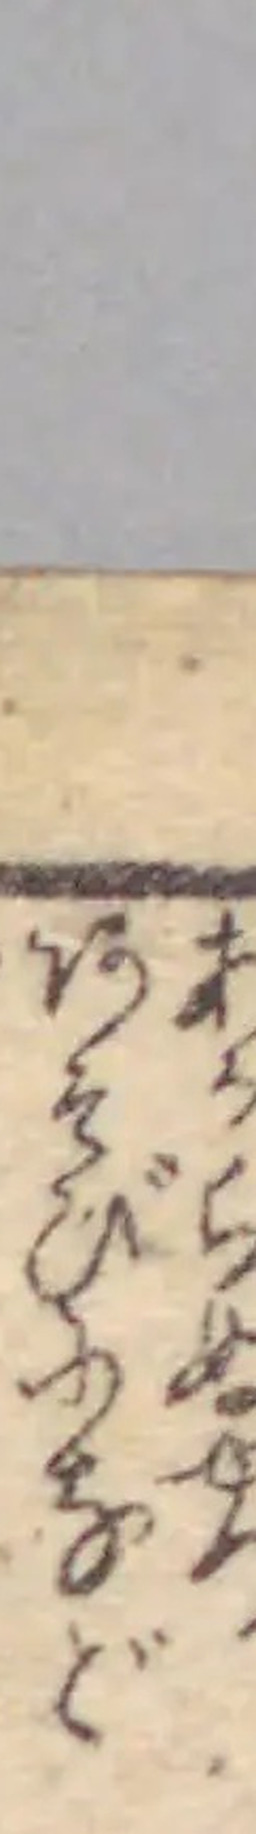あそびになど
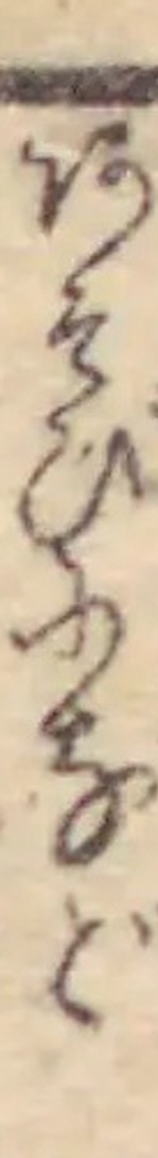あそびになど
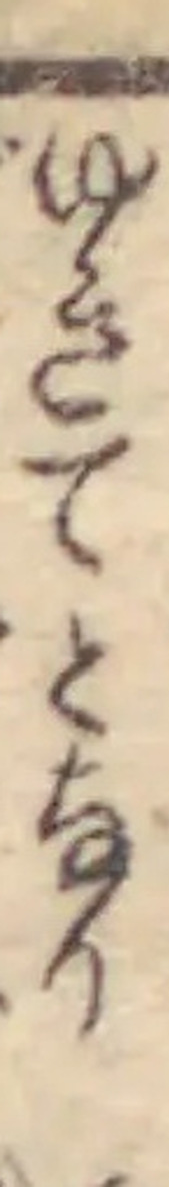ゆきてとなり
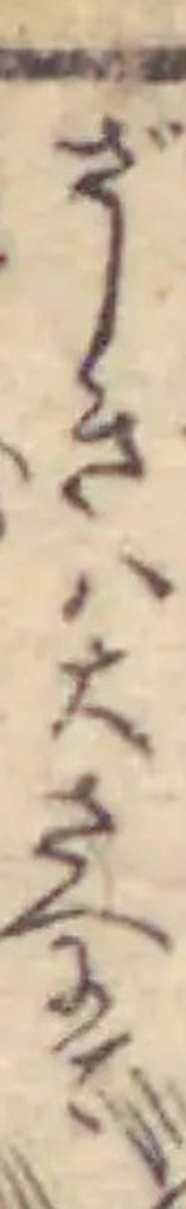ざしきは大さへにて
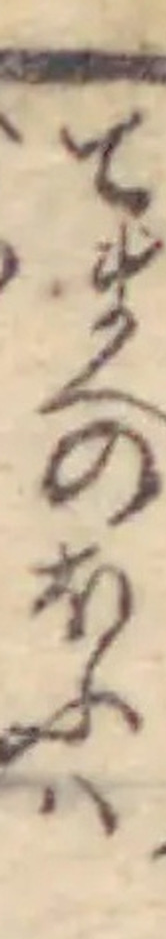てまへのほふは
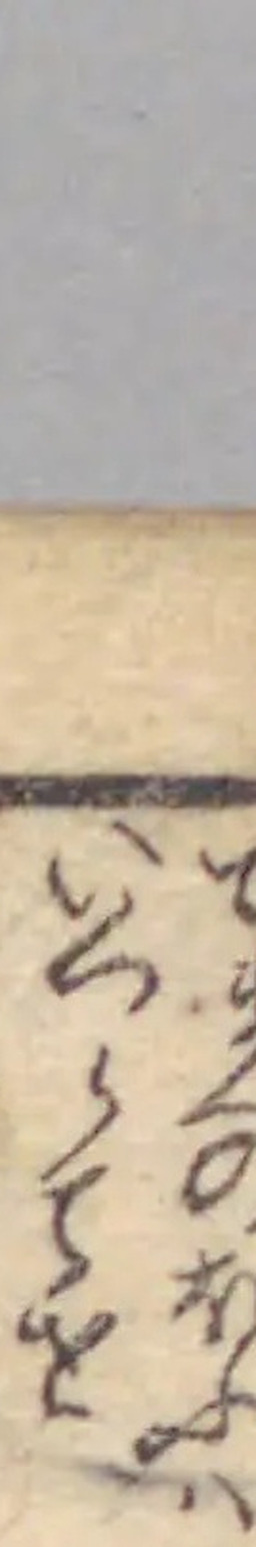いくらてを
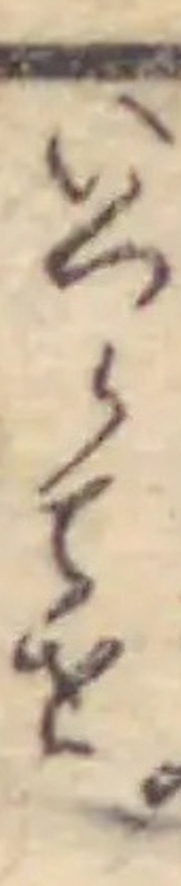いくらてを
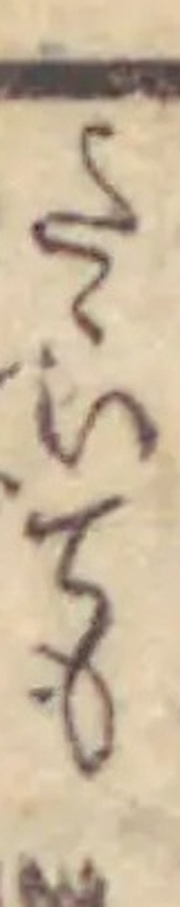たゝいても
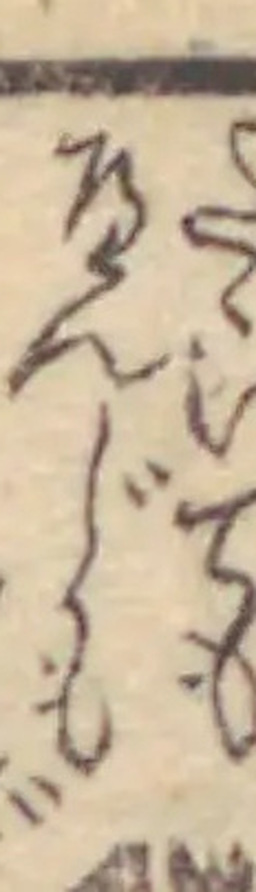へんじも
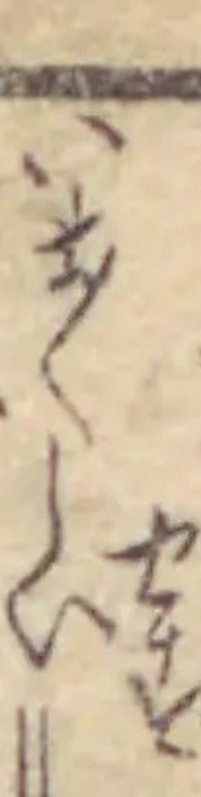いま〳〵しい
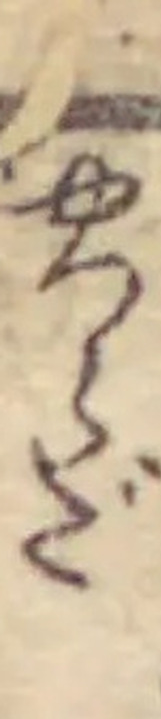やつらだ
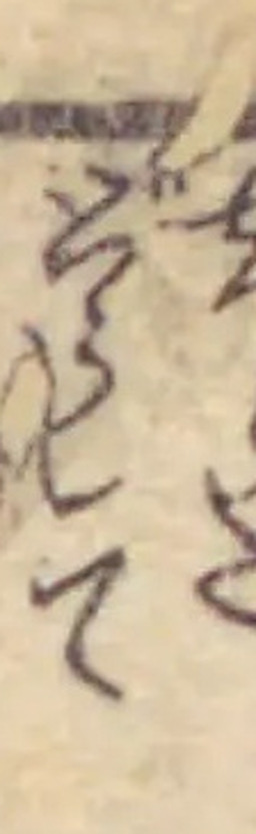どうして
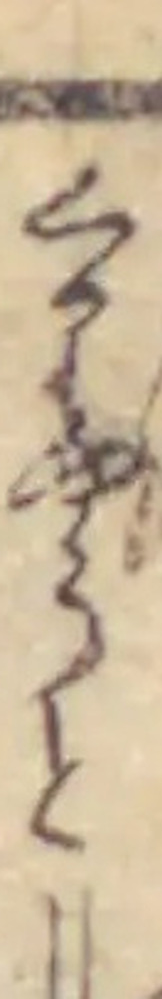くりやうと
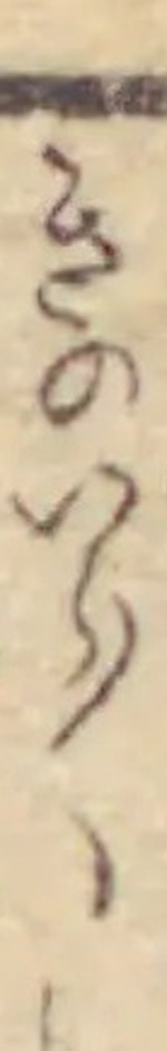きのいら〳〵
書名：家伝寿命薬 2巻
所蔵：国立国会図書館 National Diet Library, JAPAN
